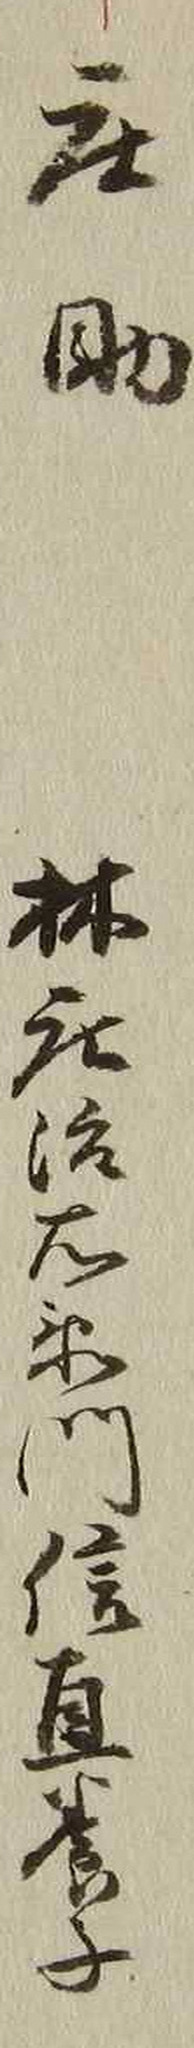庄助林庄治右衛門信直養子
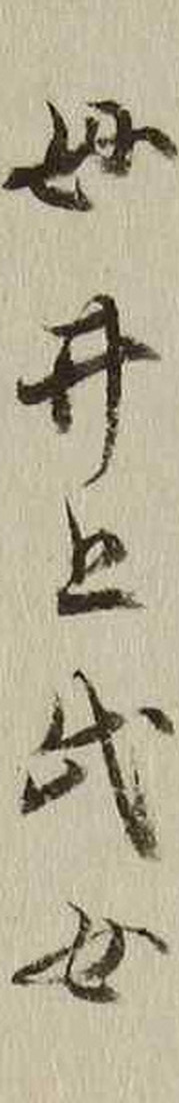母井上氏女
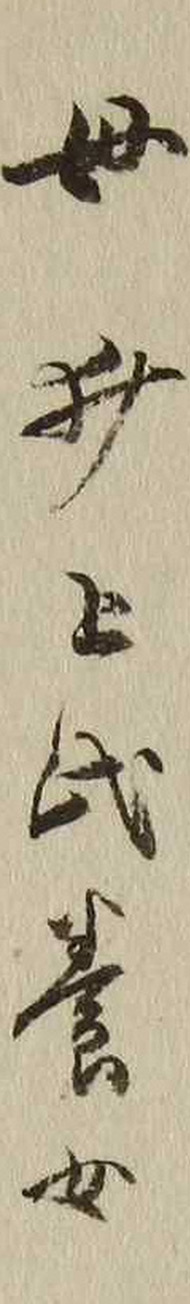母井上氏養女
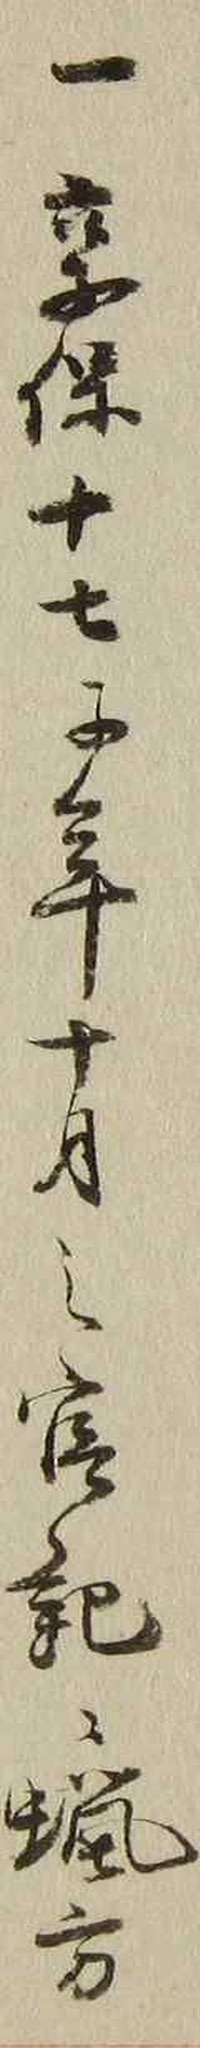一享保十七子年十月之官記ニ蝋方
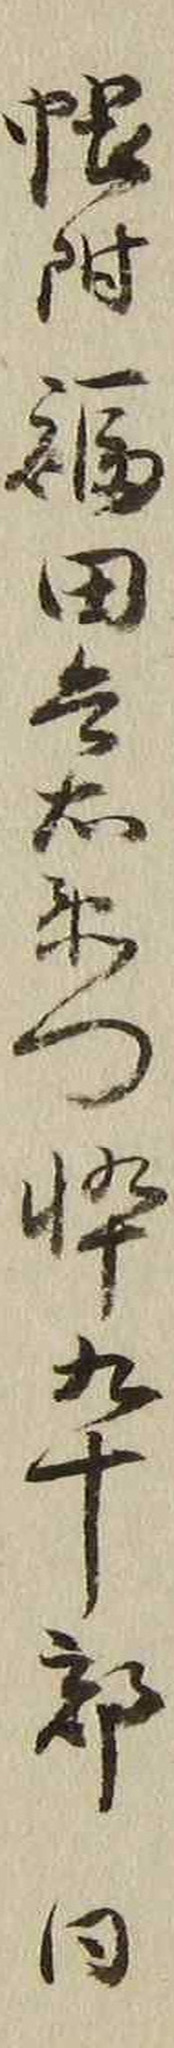帳附福田兵右衛門忰九十郎同
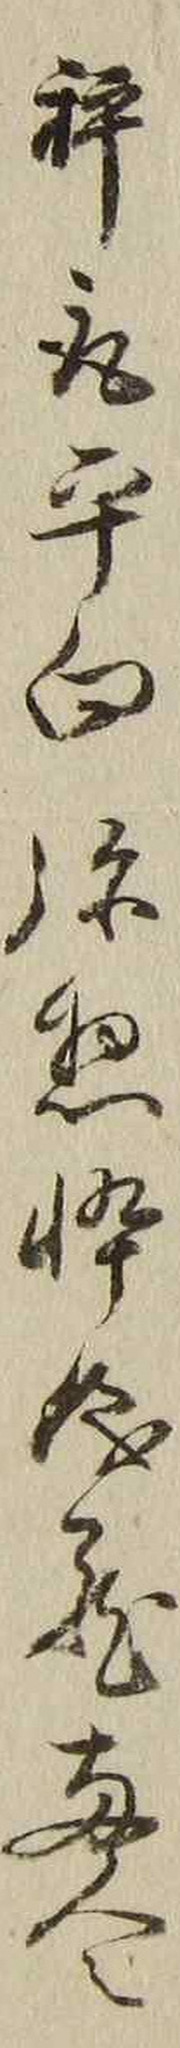秤取平向弥惣忰儀蔵両人之
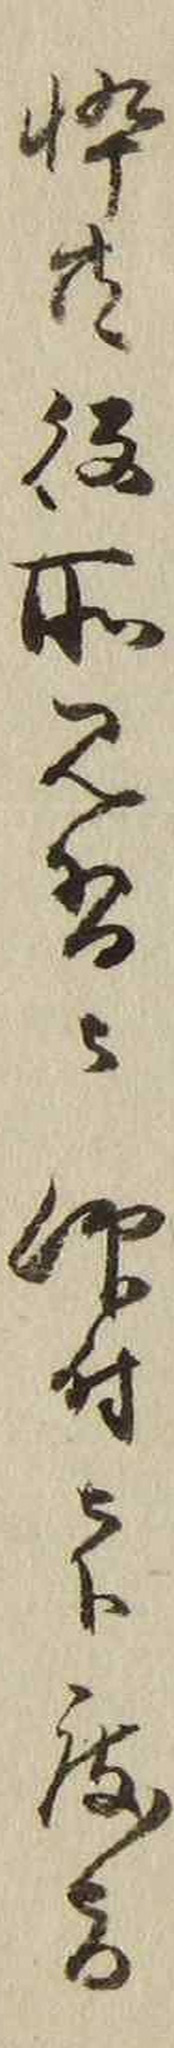忰共役所見習被仰付被下度旨

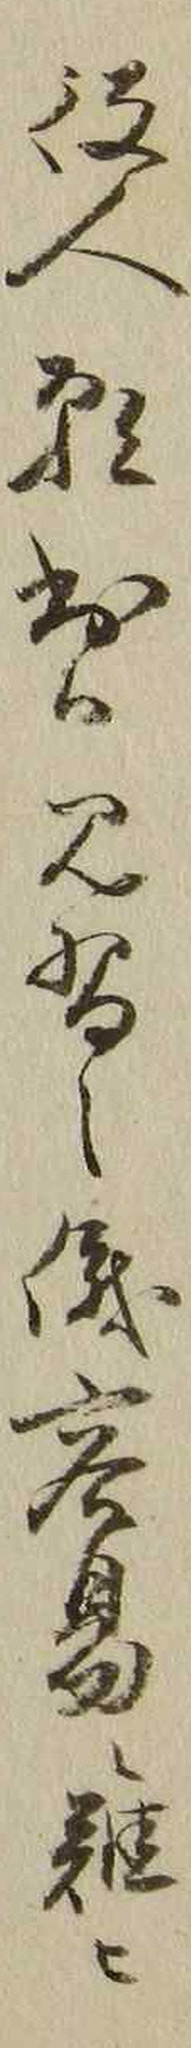役人願出候見習之儀容易ニ難被
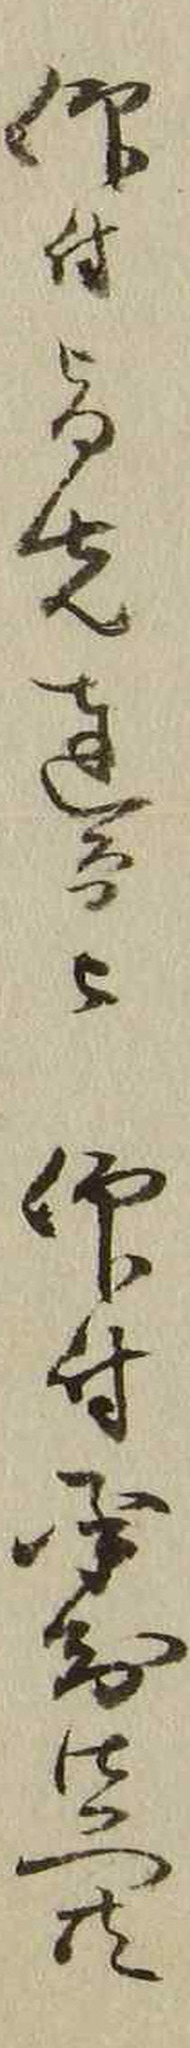仰付旨先達而被仰付承知仕候へ共
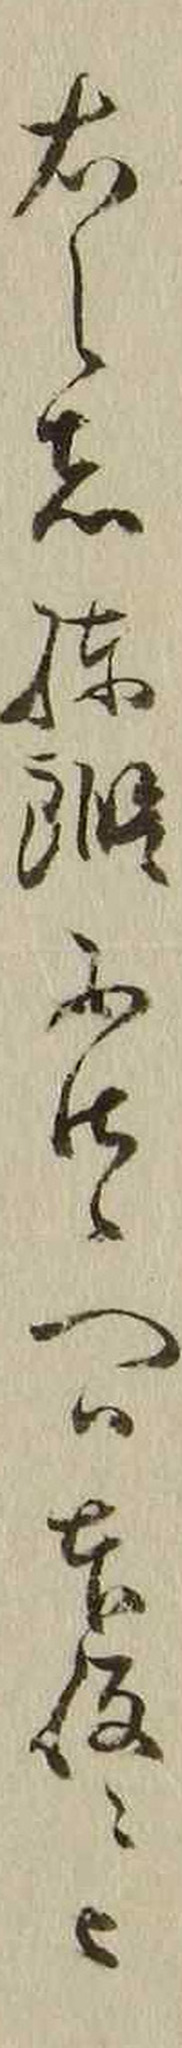右之者練鍛不仕候へハ本役ニ被
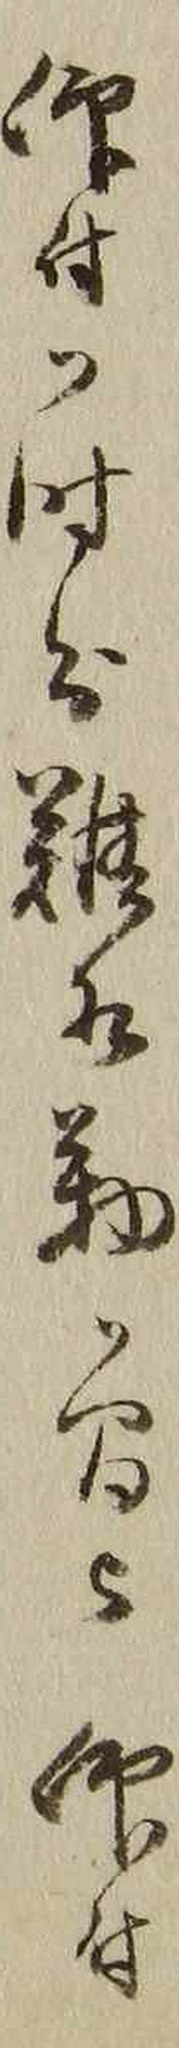仰付候時分難相勤候間被仰付
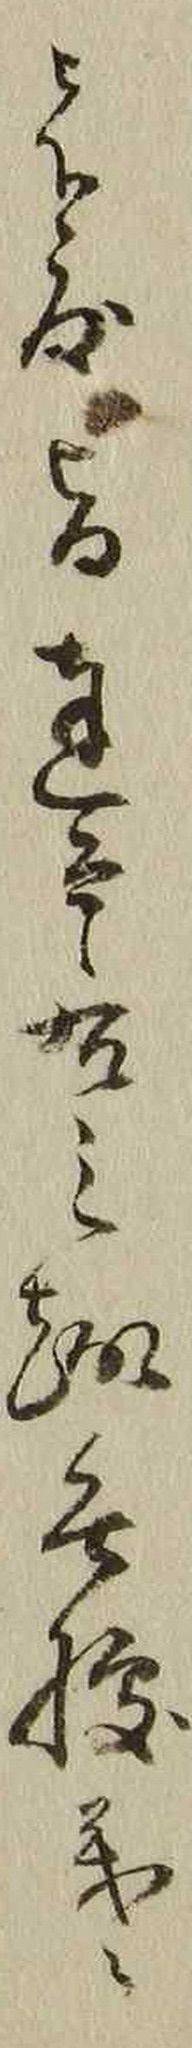被下度旨達而有之趣無拠義ニ
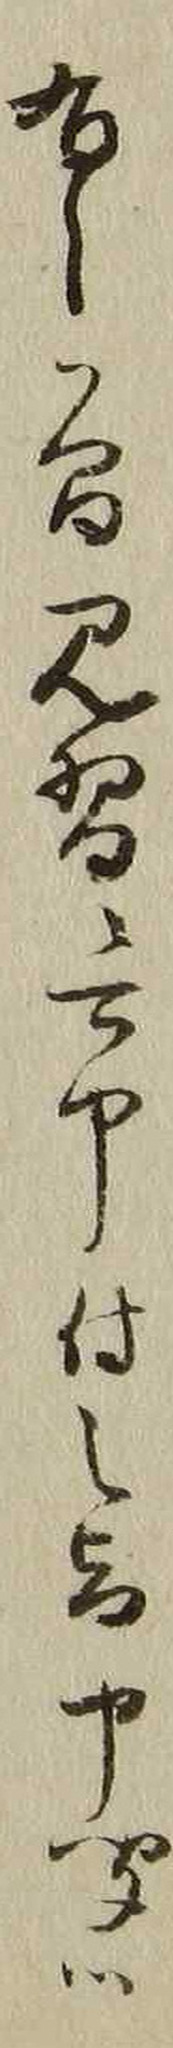有之候間見習ニ可申付之旨申聞候
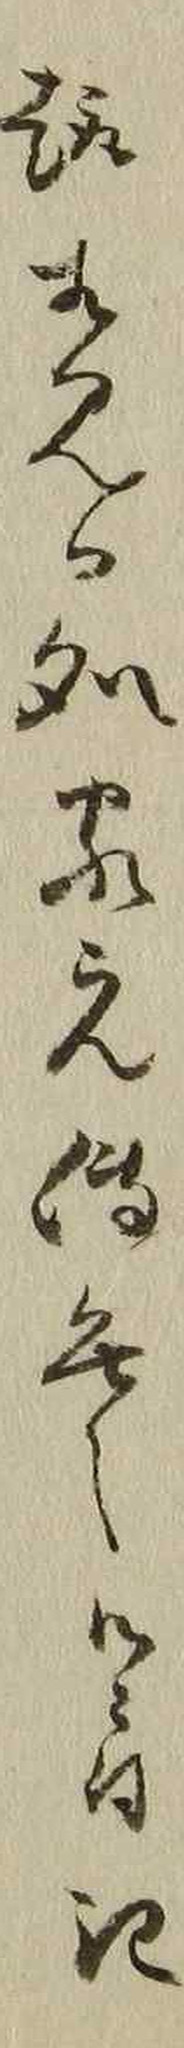趣相見候処家元伝無之候ニ付記
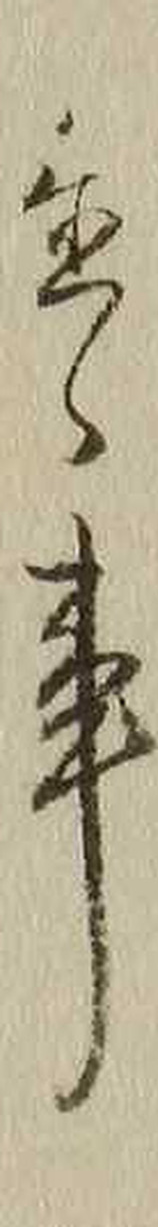置候事
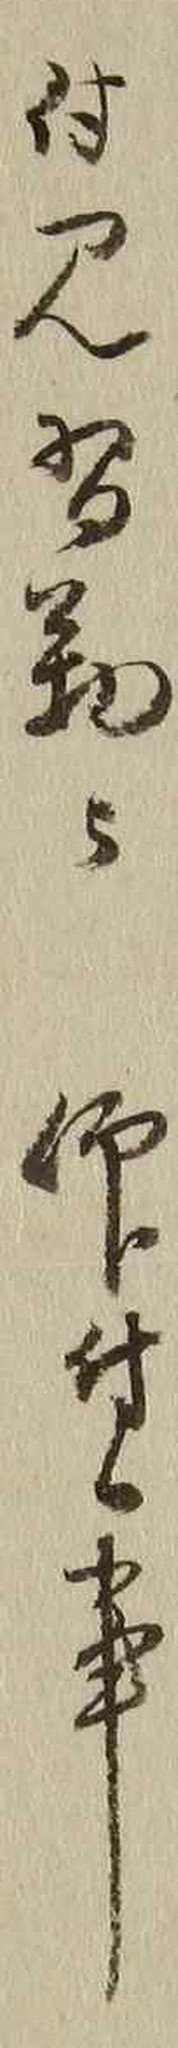付見習勤被仰付候事
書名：諸士系譜　巻之236　ふ之部4
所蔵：会津若松市立会津図書館
